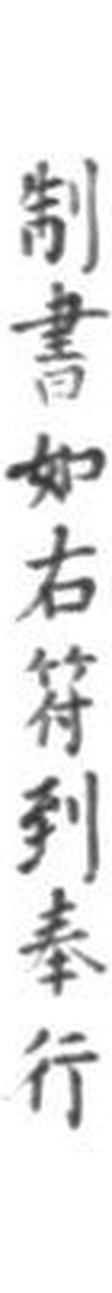制書如右符到奉行
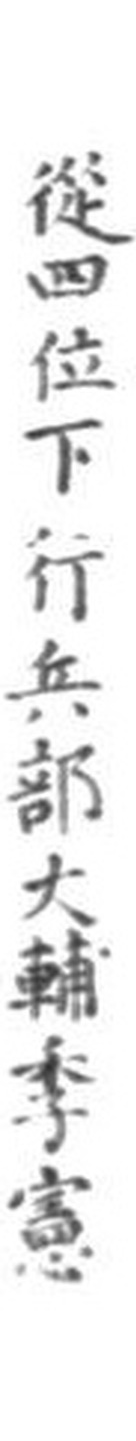従四位下行兵部大輔季憲
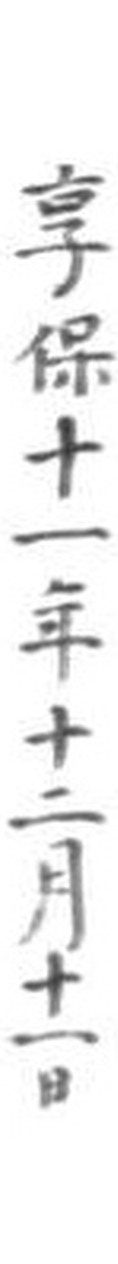享保十一年十二月十一日
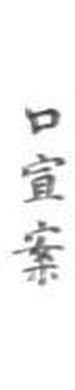口宣案
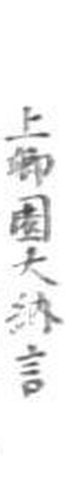上卿園大納言
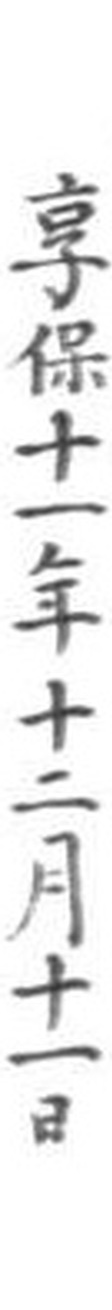享保十一年十二月十一日

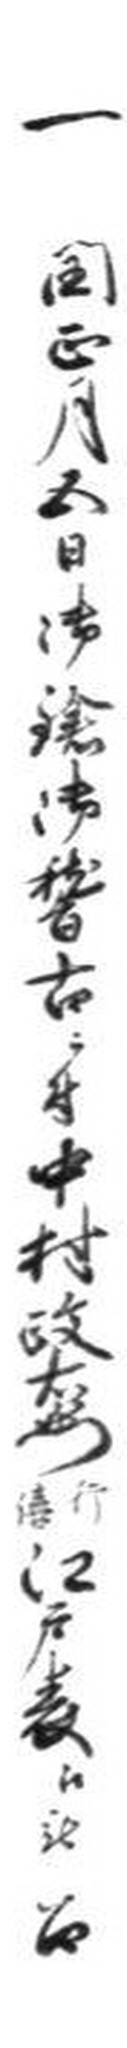一閏正月五日御鎗御稽古ニ付中村政右衛門行江戸表江被召
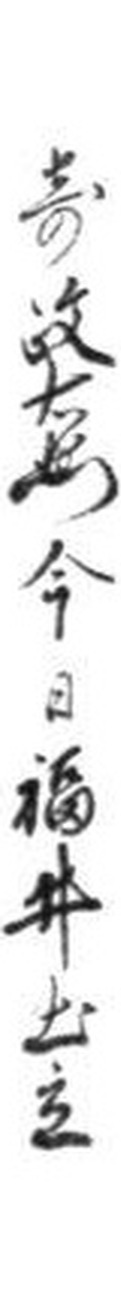寄政右衛門今日福井出立
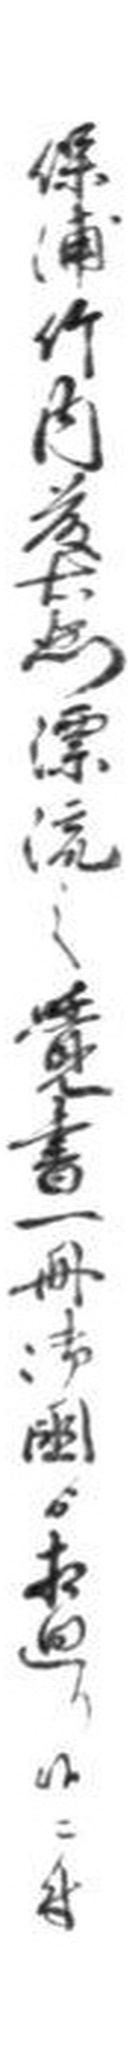保浦浦竹内藤右衛門漂流之御国ゟ相廻り候ニ付
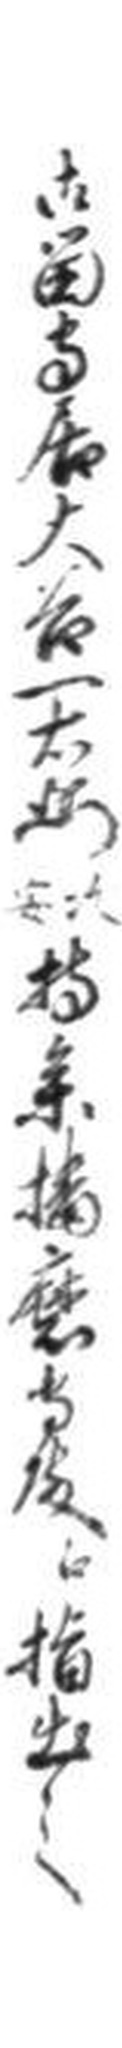御留守居大谷一右衛門次安持参播磨守殿江指出之
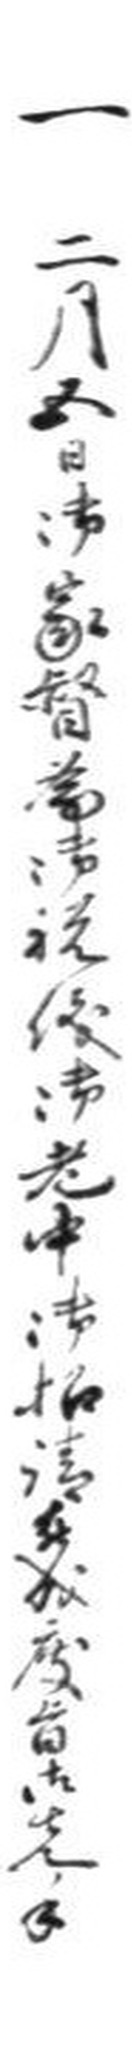一二月五日御家督為御祝儀御老中御招請被成度旨御先年
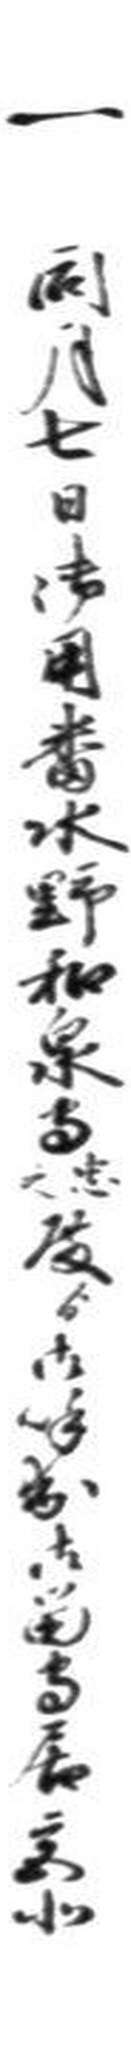一同月七日御用番水野和泉守忠之殿ゟ御呼出御留守居宮北
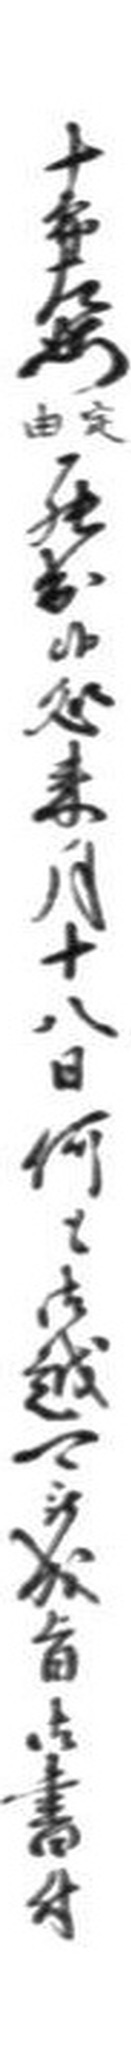十郎左衛門定由罷出候処来月十八日何も御越可被成旨御書付
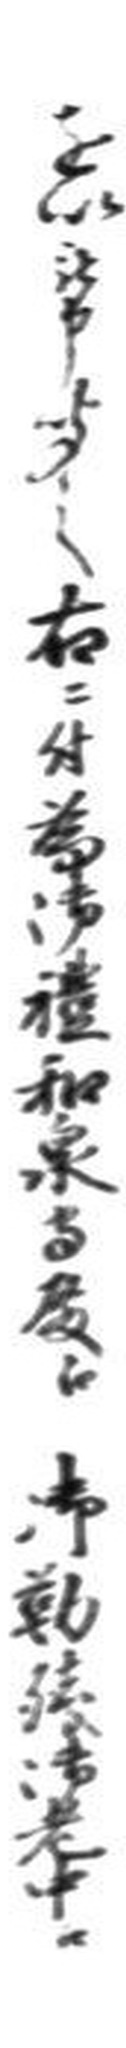を以被申聞之右ニ付為御礼和泉守殿江御勤残御老中江
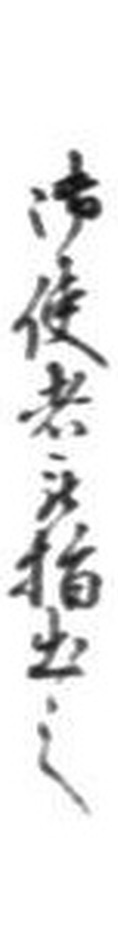御使者被指出之
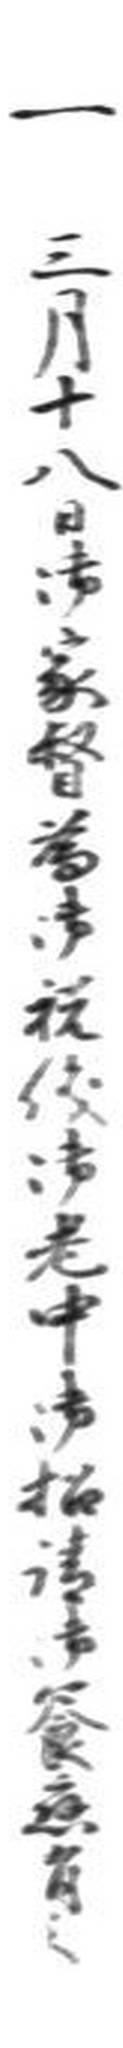一三月十八日御家督為御祝儀御老中御招請御餐応有之
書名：家譜 四十 宗矩公 従享保十一年到享保十二年
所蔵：福井県文書館 Fukui Prefectural Archives
